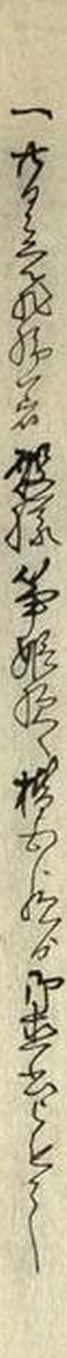一廿日立飛脚着殿様箏姫様へ楷五郎様ゟ御直書被進之
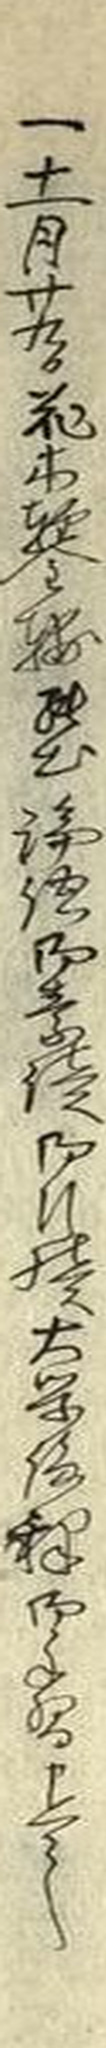一十一月廿九日花木鑋輔罷出論語御素読御引続大学講釈御手習申上之
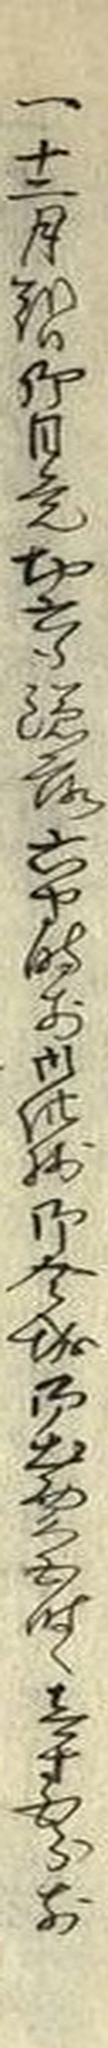一十二月朔日御目覚切六ツ鎌落六半時前御供揃御登城御出殿五時へ壱寸五分前
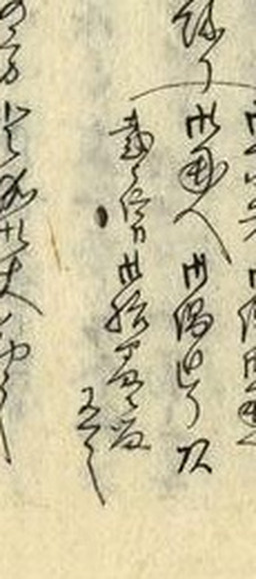戴被仰付御膳番ニ留有之
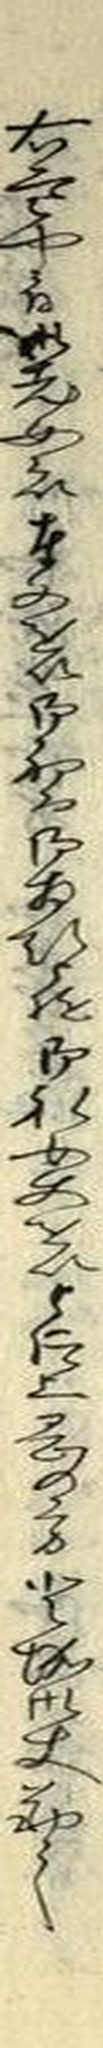右寒中ニ付御老女衆奉文を以御初而御拝領被遊御礼女使を以被仰上岡の方登城御使勤之
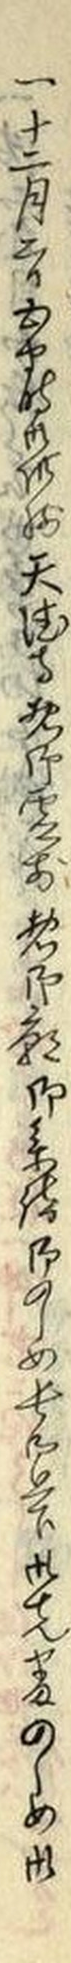一十二月二日五半時御供揃天徳寺惣御霊前惣御廟御参詣御のしめ長御上下御先番のしめ御
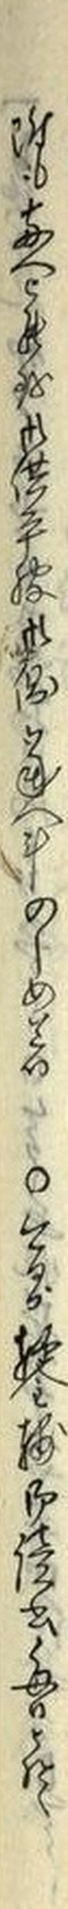附も両人被罷越御供平服御側御用人斗のしめ着〇今日ゟ鑋輔御読書毎日被遊候
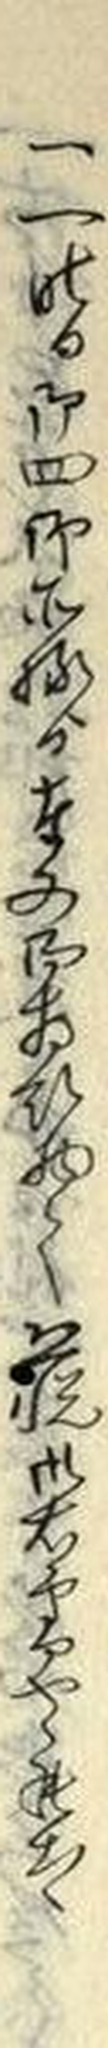一一昨日御四御所様ゟ奉文御拝領物之恐悦御右筆部屋へ罷出候
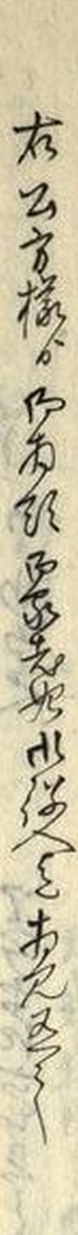右公方様ゟ御拝領御家老始御役人迄拝見有之
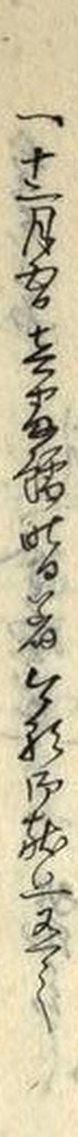一十二月五日壱番鱈昨日着今朝御献上有之
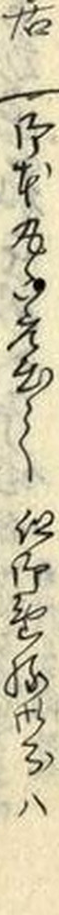御本丸へ差出之但御台様御分ハ
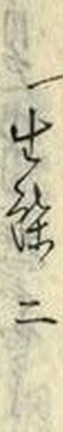生鰈二
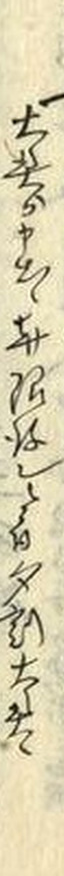大奥ゟ申出候刻限後レ候ニ付夕刻大奥へ出之
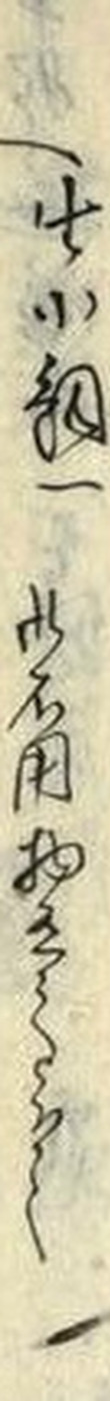生小鯛一御不用物有之被下之
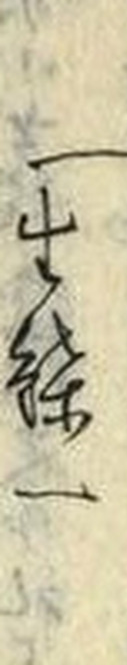生鰈二

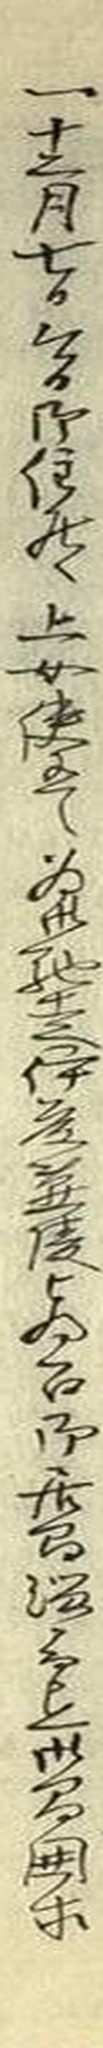一十二月七日今日御住居へ上女使有之為御馳走伊藤燕凌被為召御居間溜ニ而申上御間囲等是迄之通
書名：少傅日録抄（斉善付側向頭取日記、在府）
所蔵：福井県文書館 Fukui Prefectural Archives
